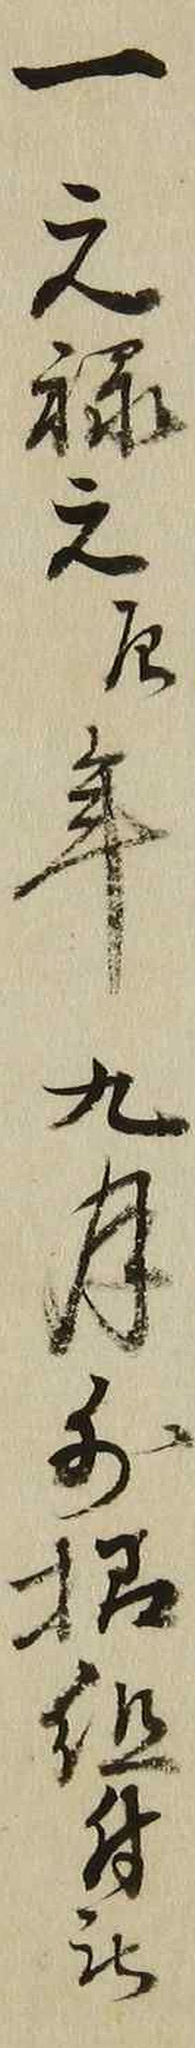一元禄元辰年九月外様組付被
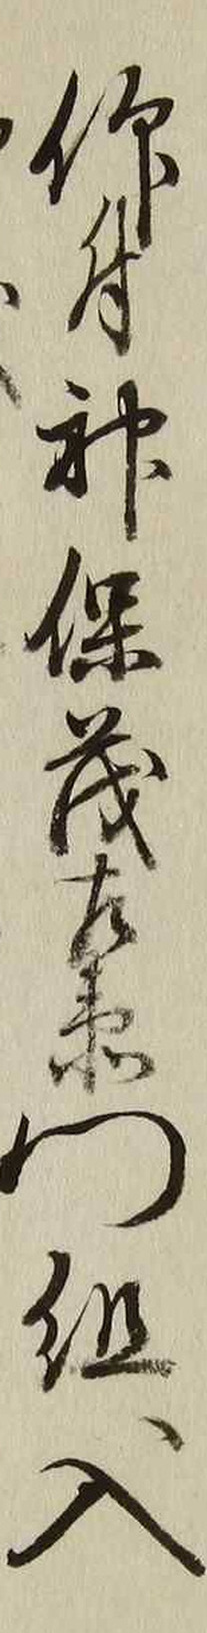仰付神保茂左衛門組へ入
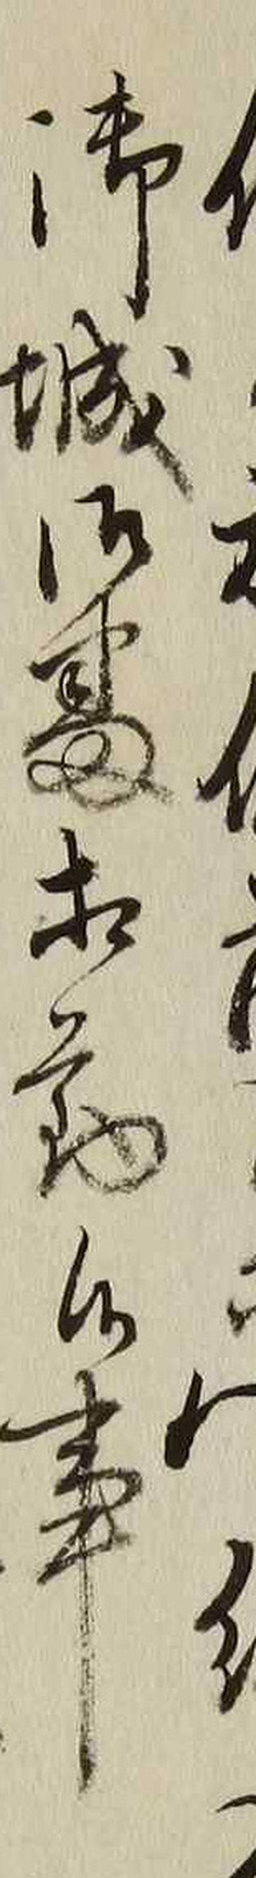御城御番相勤候事
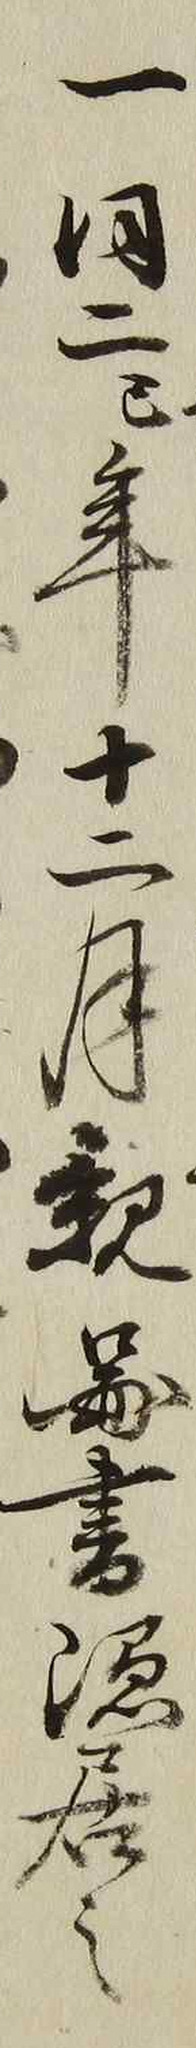一同二巳年十二月親図書隠居之
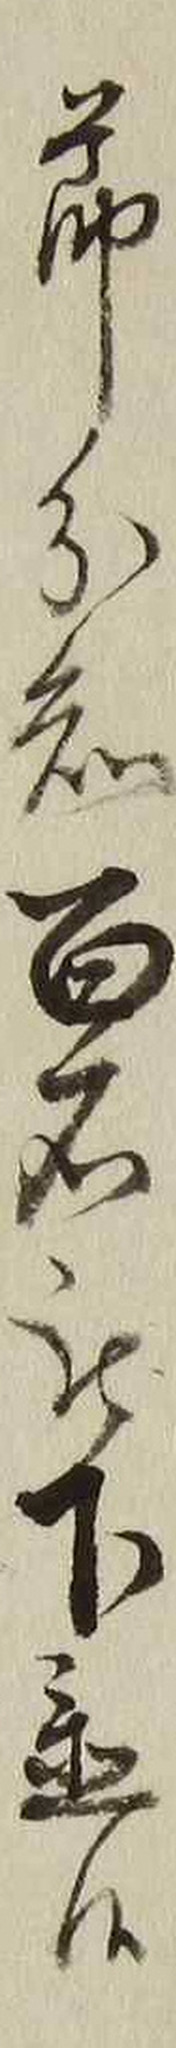節分知百石被下置候
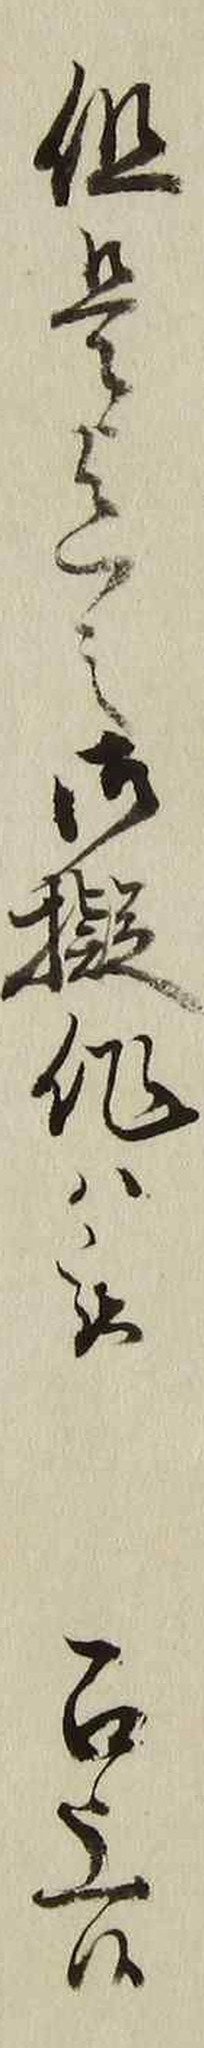但是迄之御擬作ハ被召上候
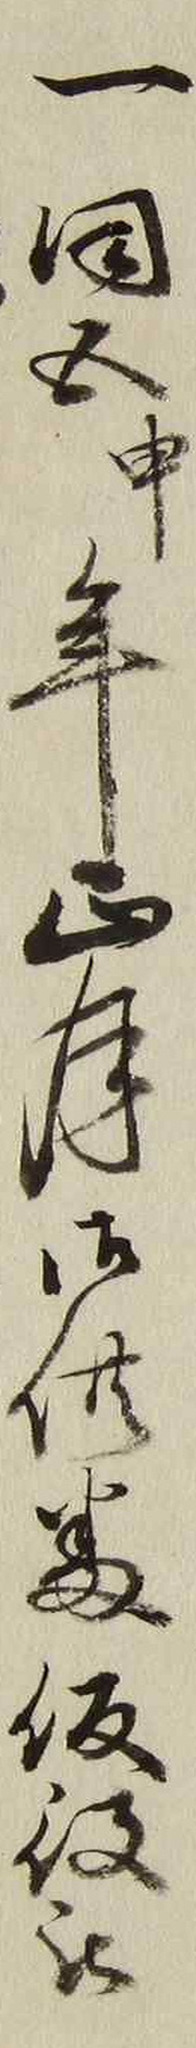一同五申年正月御供番仮役被
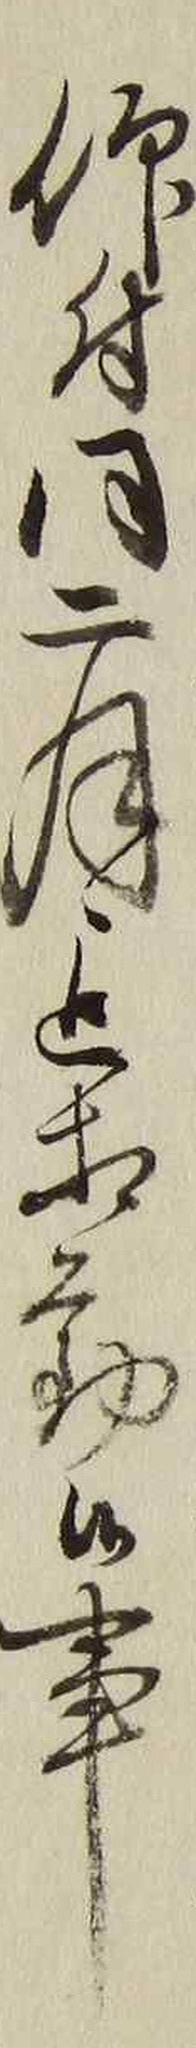仰付同二月迄相勤候事
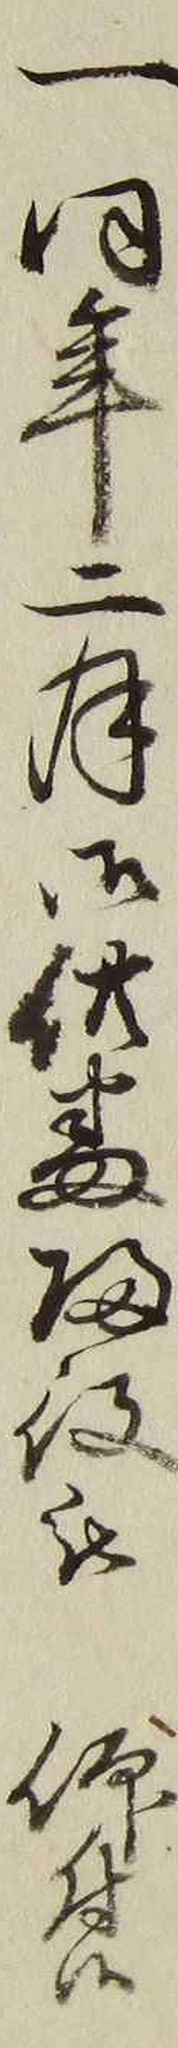一同年二月御供番帰役被仰付候

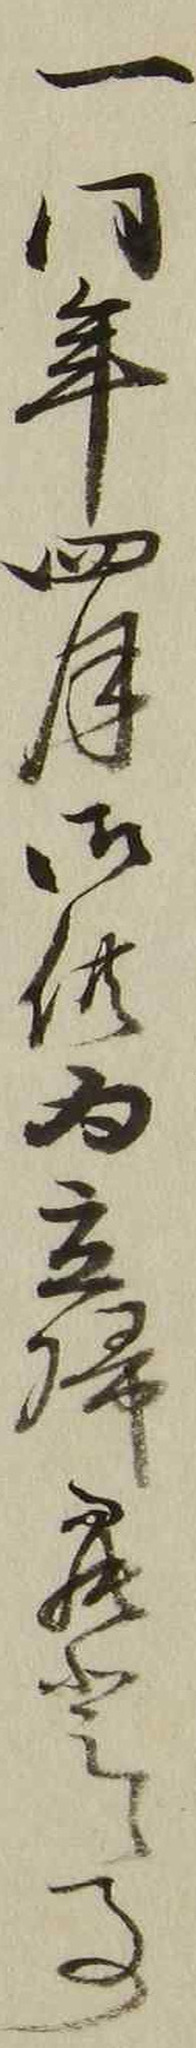一同年四月御供為立帰罷登候事
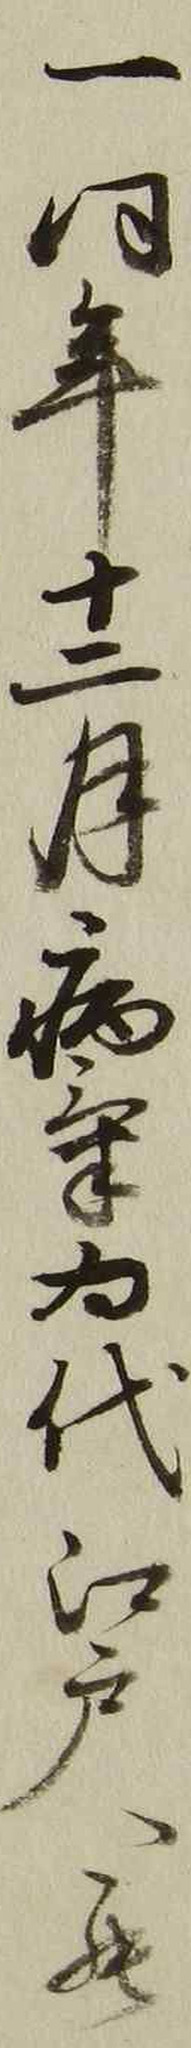一同年十二月病気為代江戸へ罷
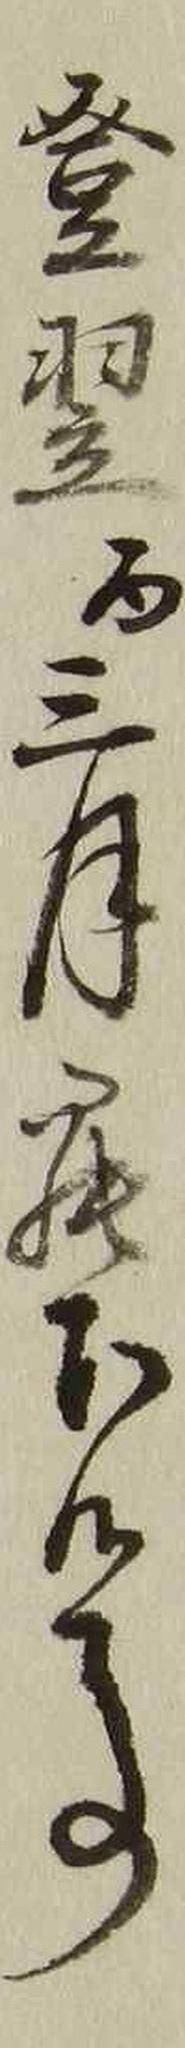登翌酉三月罷下候事
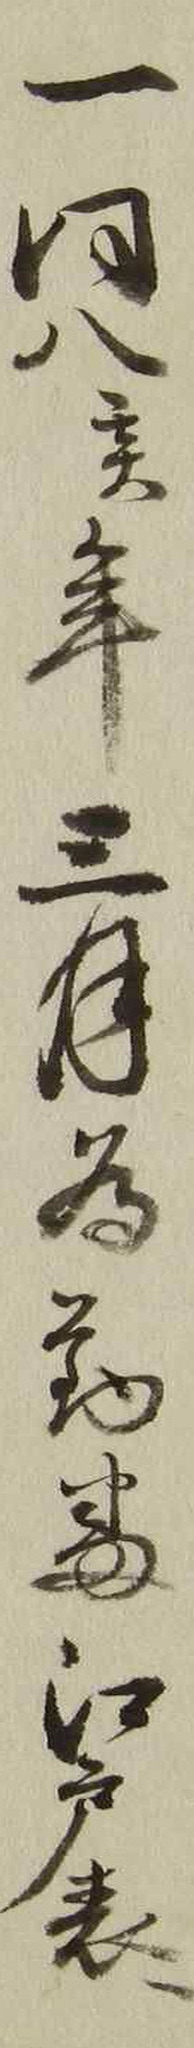一同八亥年三月為勤番江戸表へ
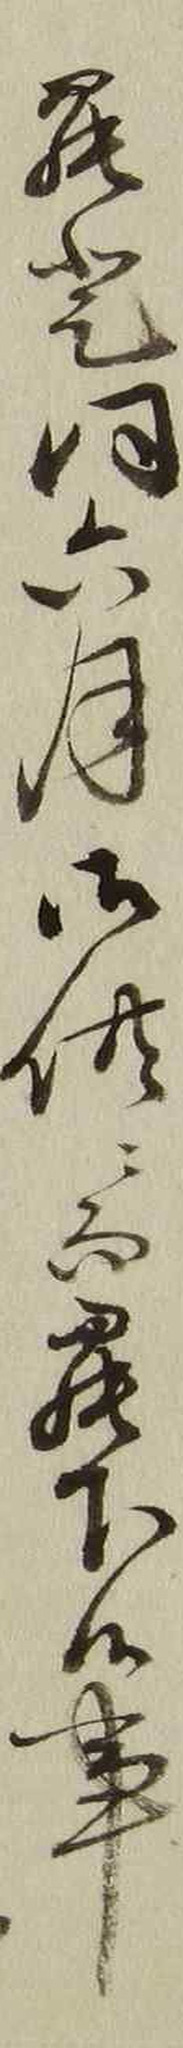罷登同六月御供ニ而罷下候事
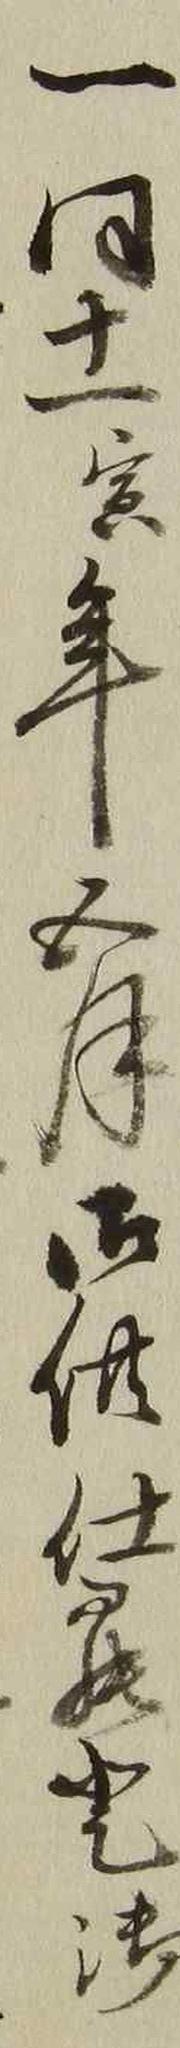一同十一寅年五月御供仕罷登御
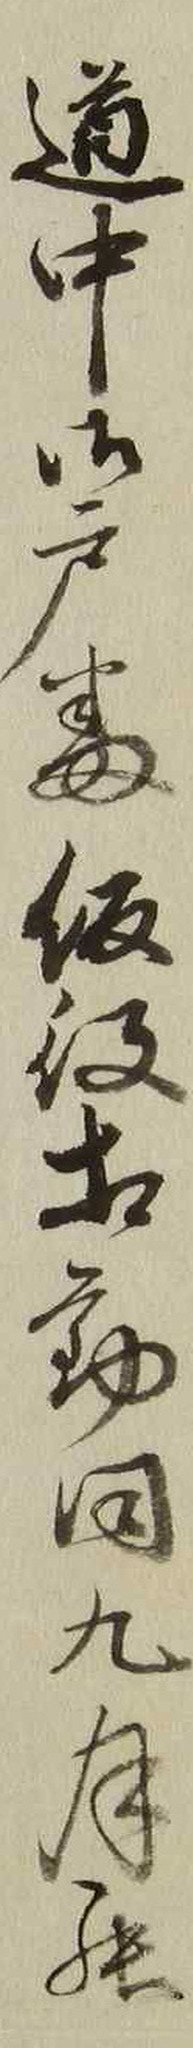道中御戸番仮役相勤同九月罷
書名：諸士系譜　巻之35　は之部3
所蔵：会津若松市立会津図書館
